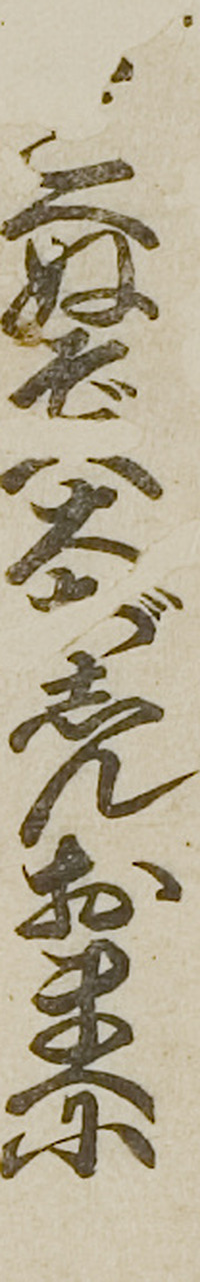こへぬぞへ大ぢしんおまへに
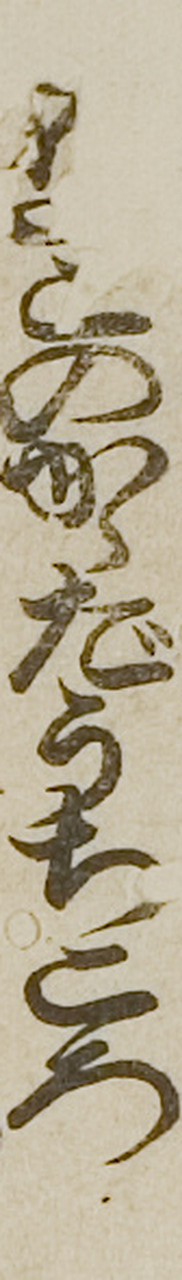このからだうちころ
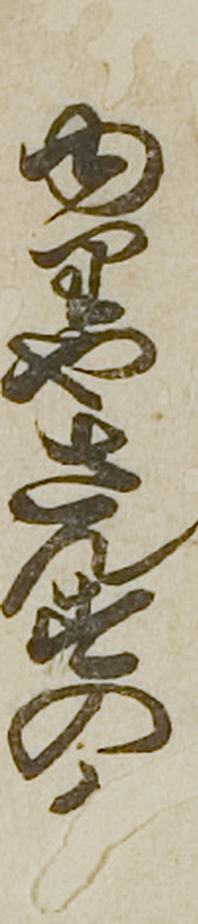ゆりやさんすの
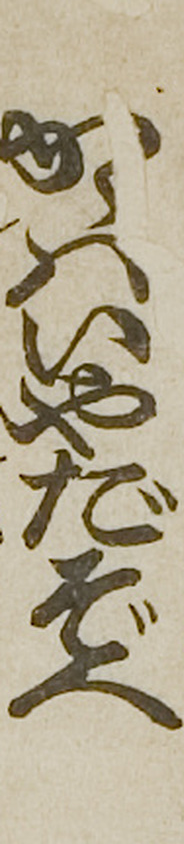からはいやだぞへ
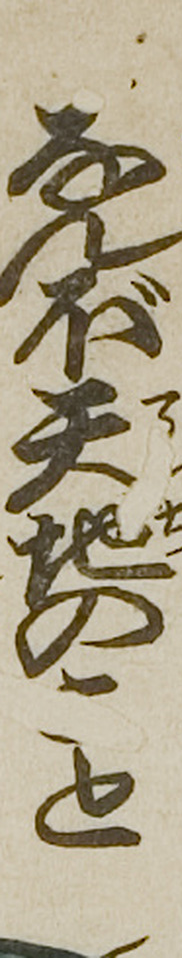なんぼ天地のこと
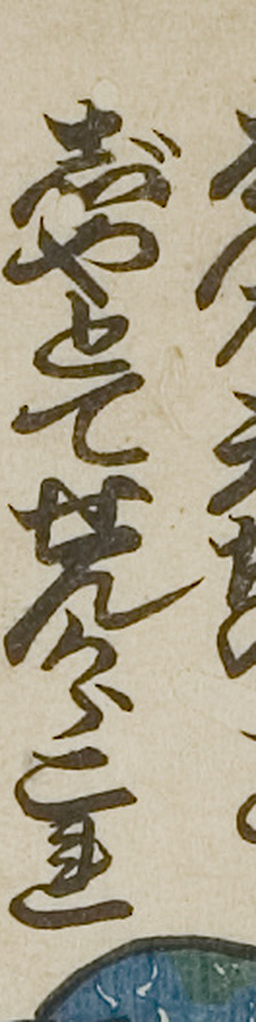じやとてせんからこれ
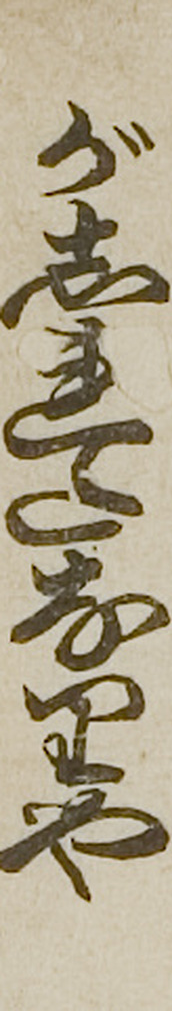がしれたなりや
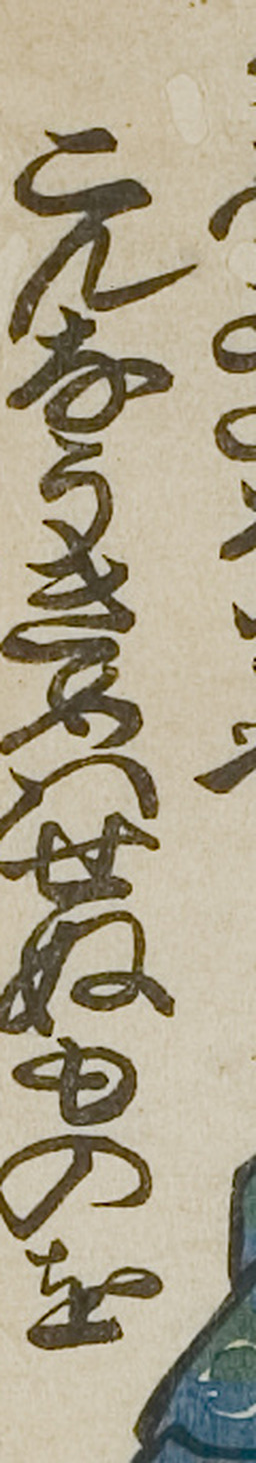こんなうきめはせぬものを
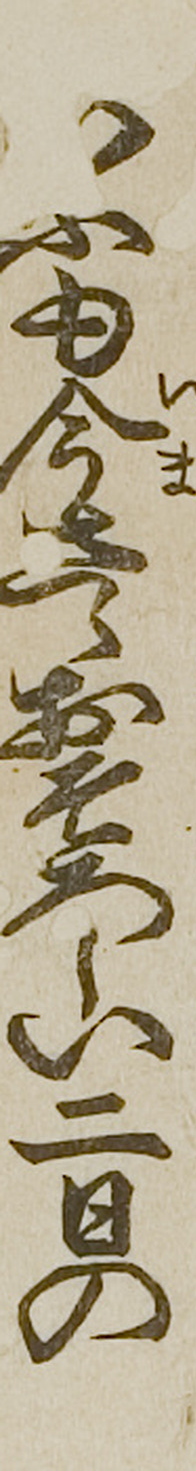いふも今さらおそろしい二日の
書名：二日の夜今度の恨
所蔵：東京大学総合図書館 General Library in the University of Tokyo, JAPAN
